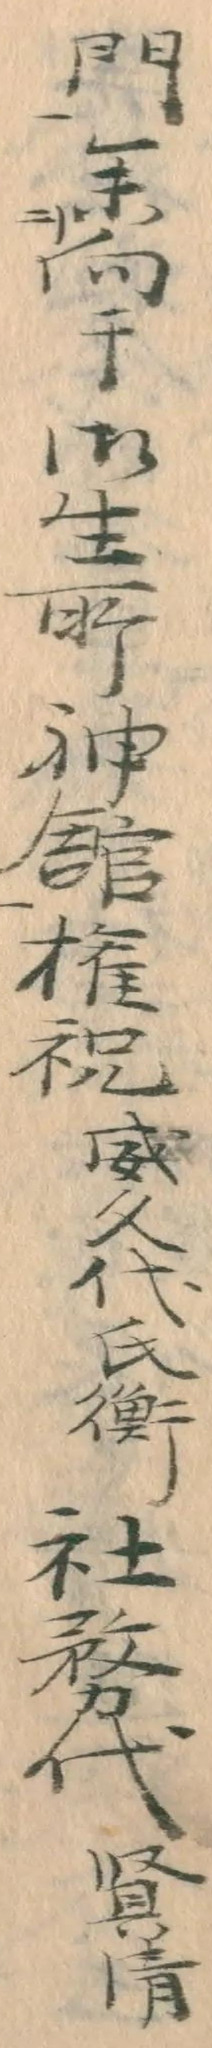門参向于御生所神舘権祝威久代氏衡社務代賢清
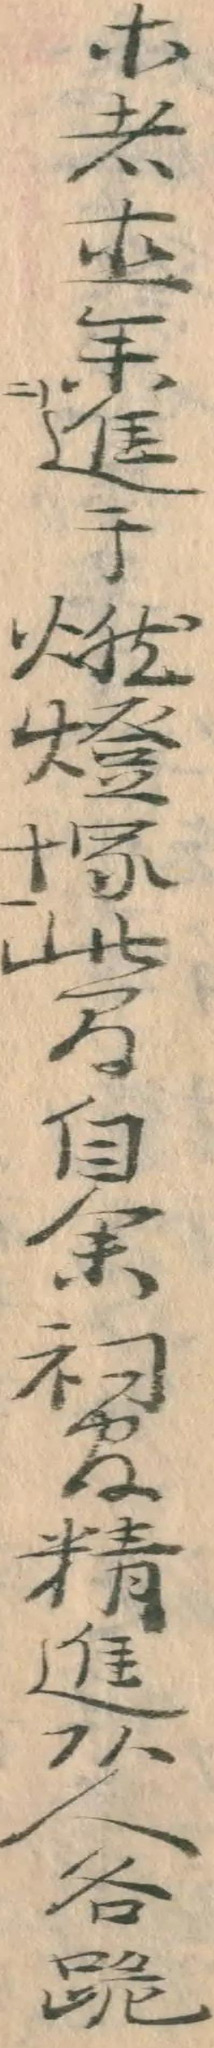等者直参進于燃燈塚此間自余祠官精進頭人各跪
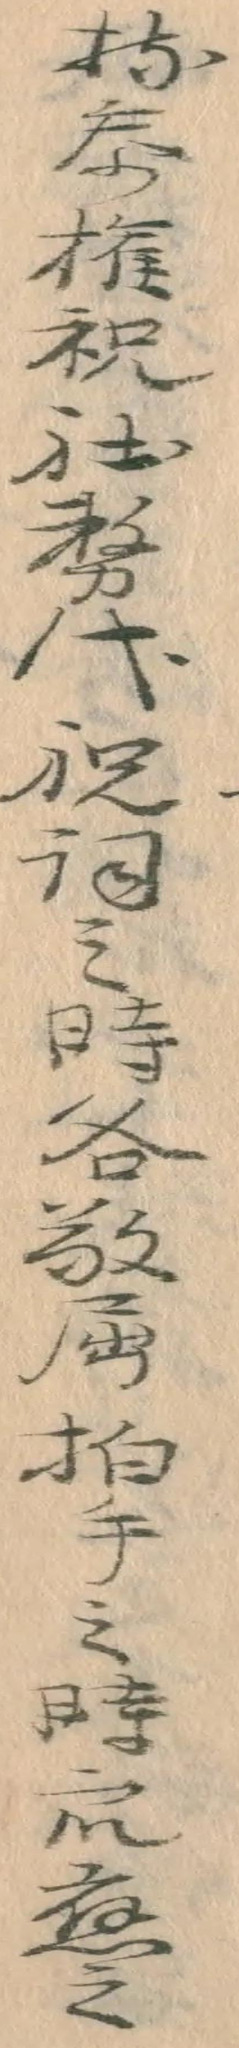持参権祝社務代祝詞之時各敬屈拍手之時衆應之
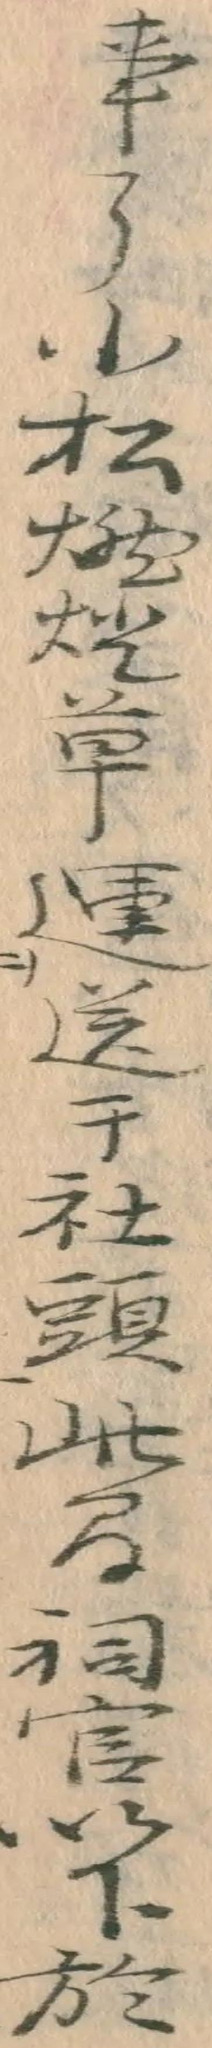事了小松燃燈草運送于社頭此間祠官以下於
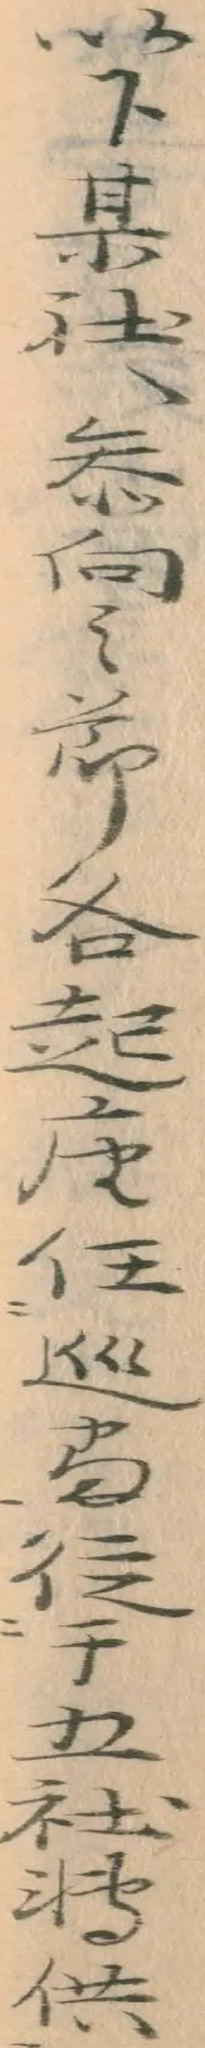以下某社へ参向之節各起唐任巡番徒于五社轉供
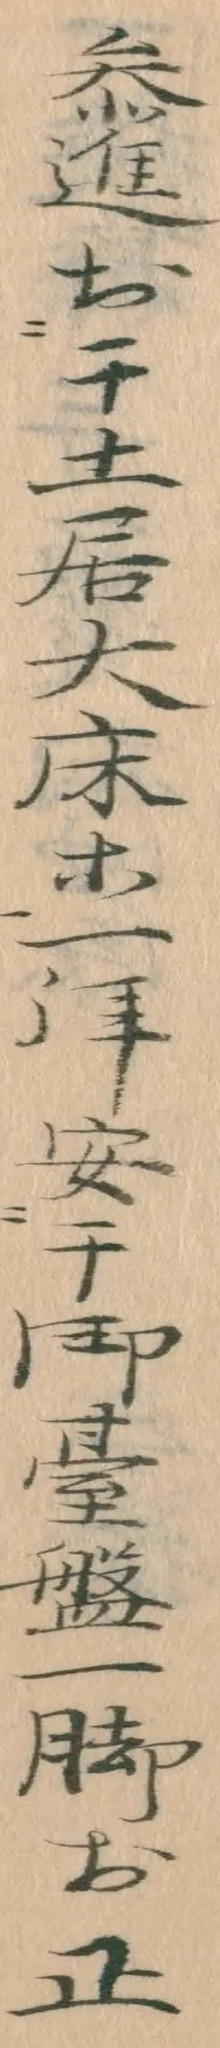参進於于土居大床等一拝安于御䑓盤一脚於正
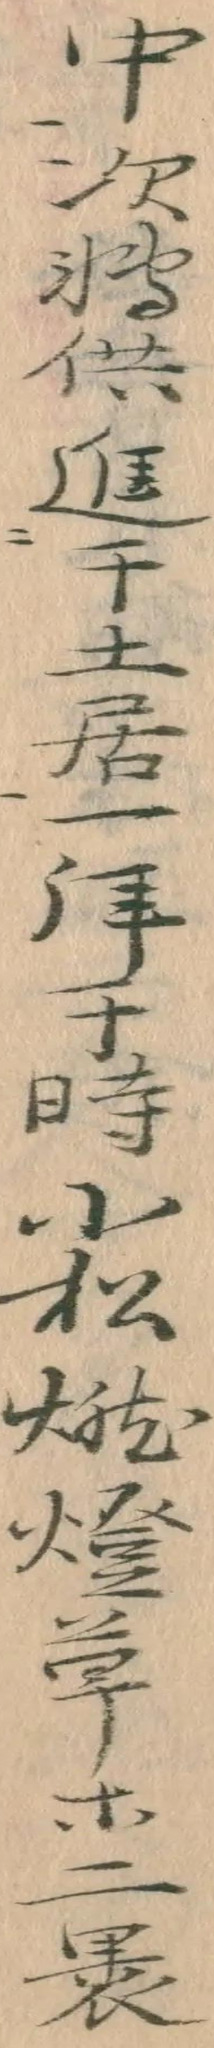中次轉供進于土居一拝于時小松燃燈草等二褁
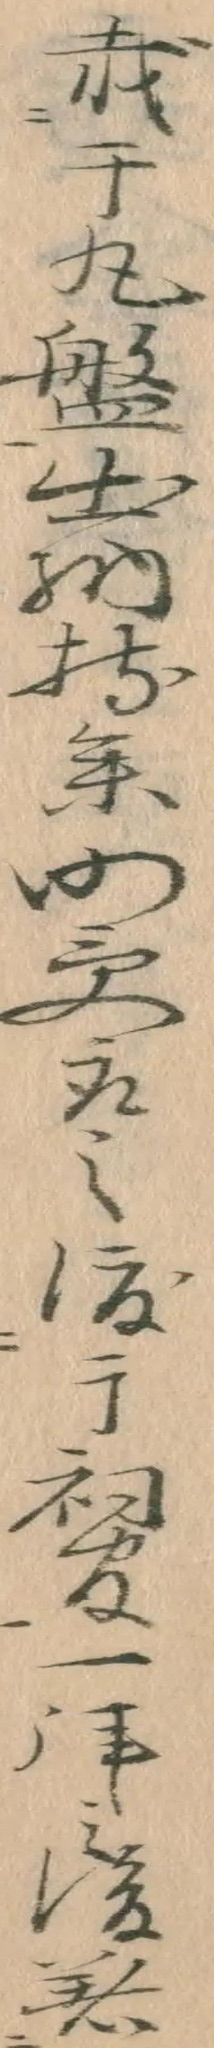載于丸盤出納持参仍受取之渡于祠官一拝之後著
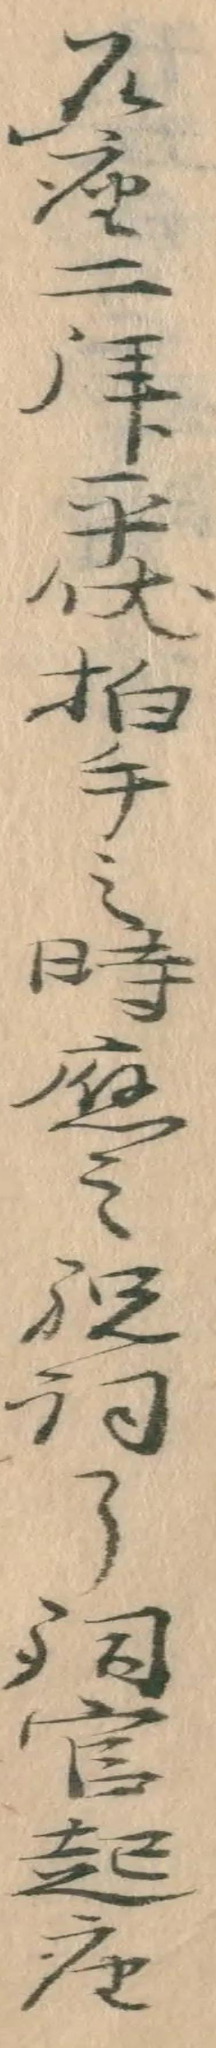乍座二拝平伏拍手之時應之祝詞了詞官起座
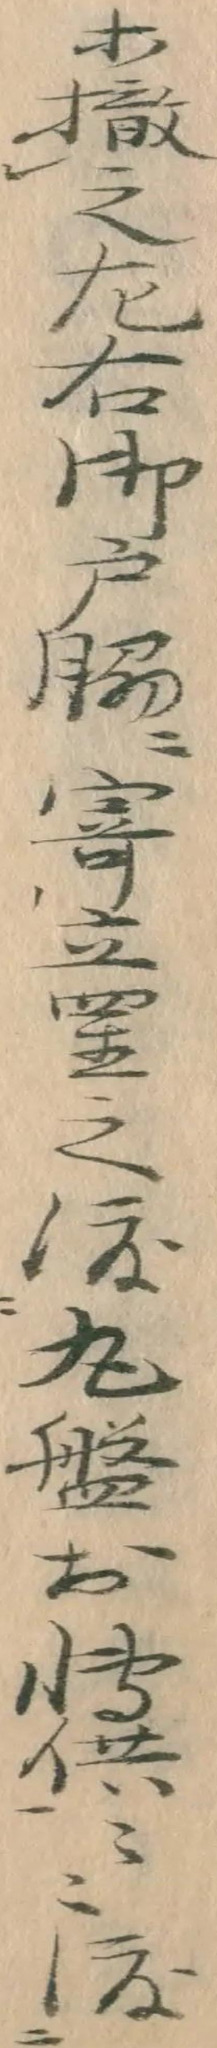等撒之左右御戸脇ニ寄立置之渡丸盤於轉供々々渡

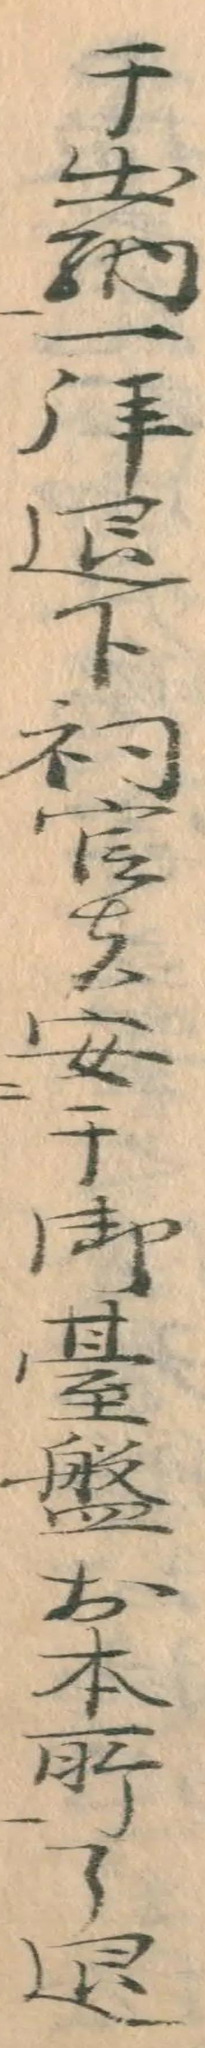于出納一拝退下祠官者安于御䑓盤於本所了退
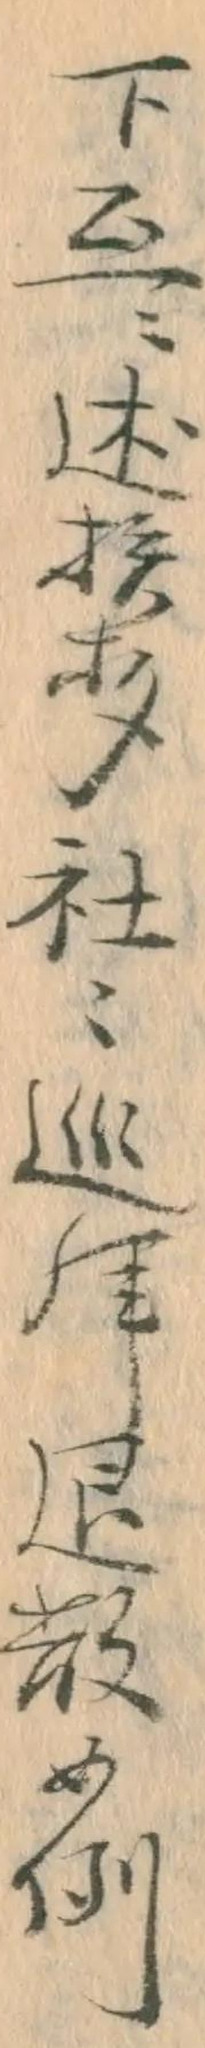下互ニ述挨拶社々巡拝退散如例
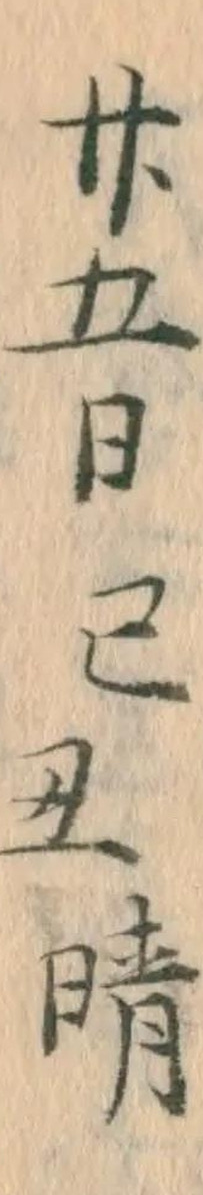廿五日己丑晴
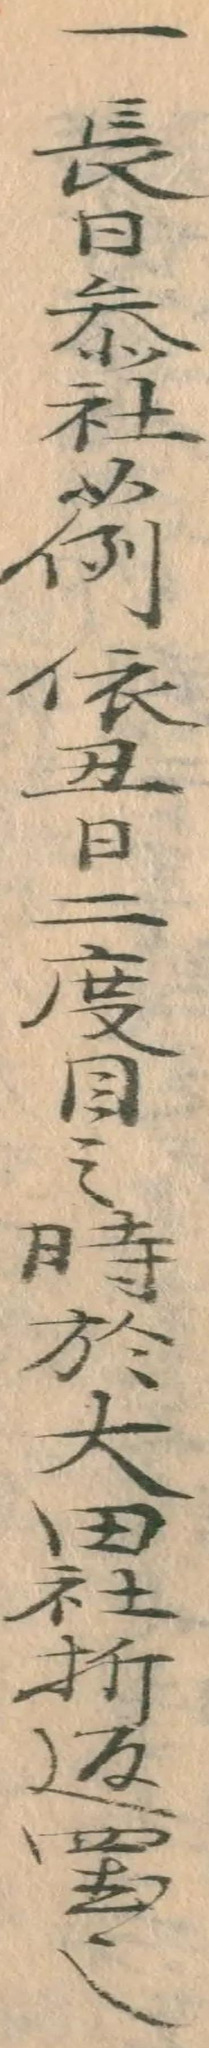一長日参社如例依丑日二度目之時於大田社折返置也
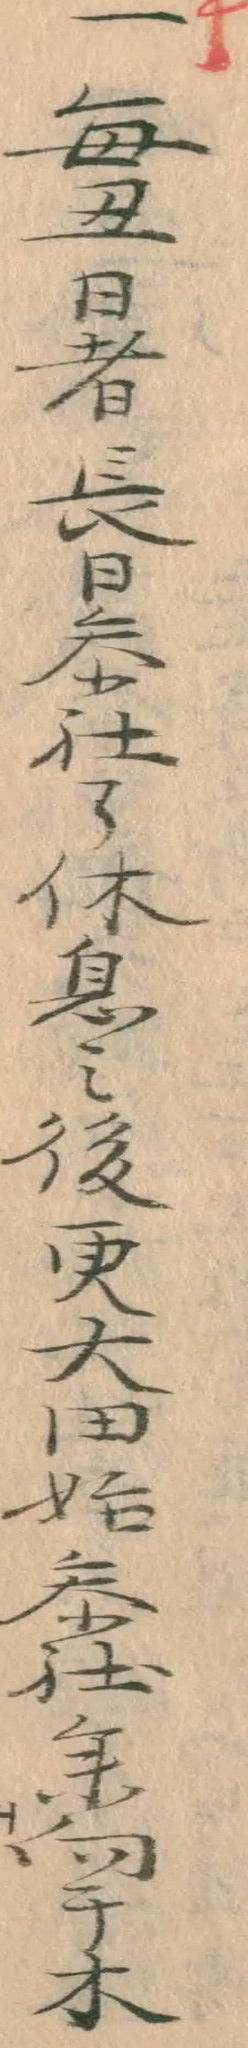一毎丑日者長日参社了休息之後更大田始参社参向于木
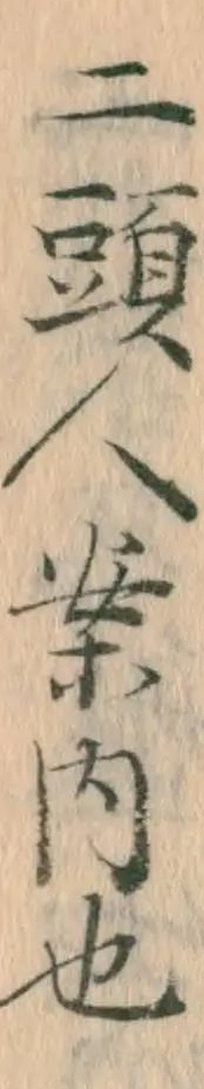二頭人案内也
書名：賀茂社記録. 第72冊
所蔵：国立国会図書館 National Diet Library, JAPAN
